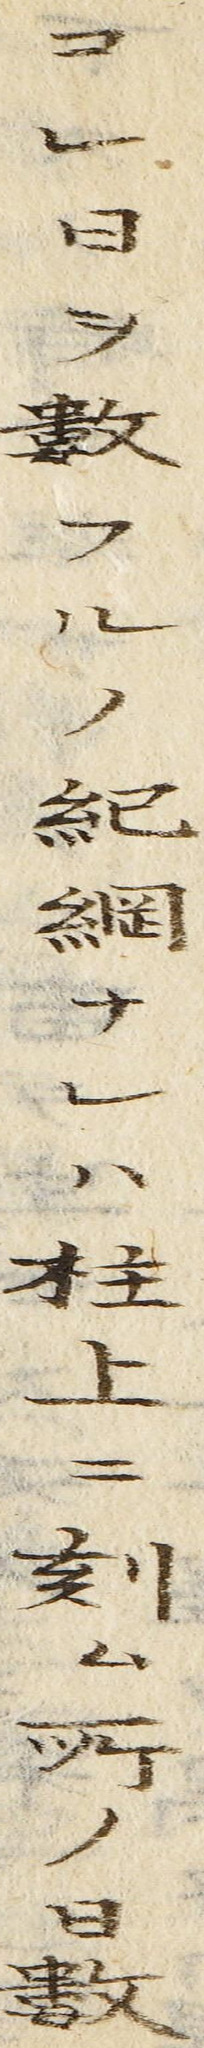コレ日ヲ数フルノ紀綱ナレハ柱上ニ刻ム所ノ日数
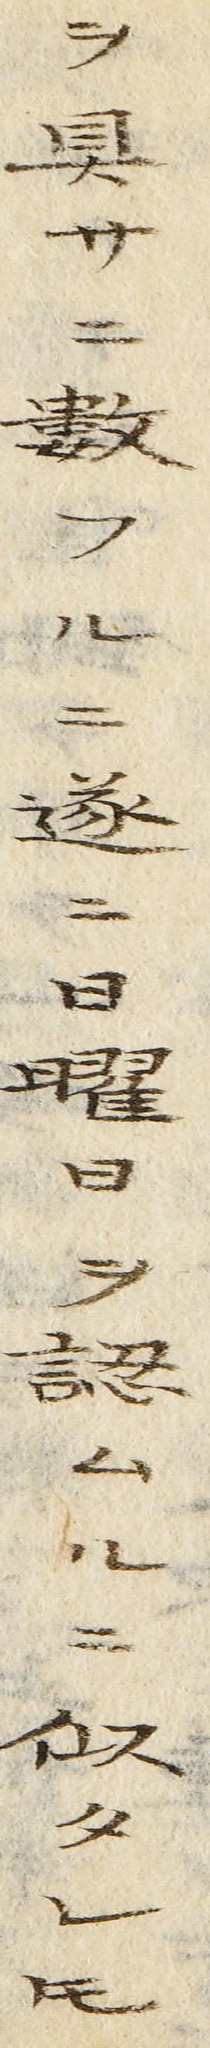ヲ具サニ数フルニ遂ニ日曜日ヲ認ムルニ似タレトモ
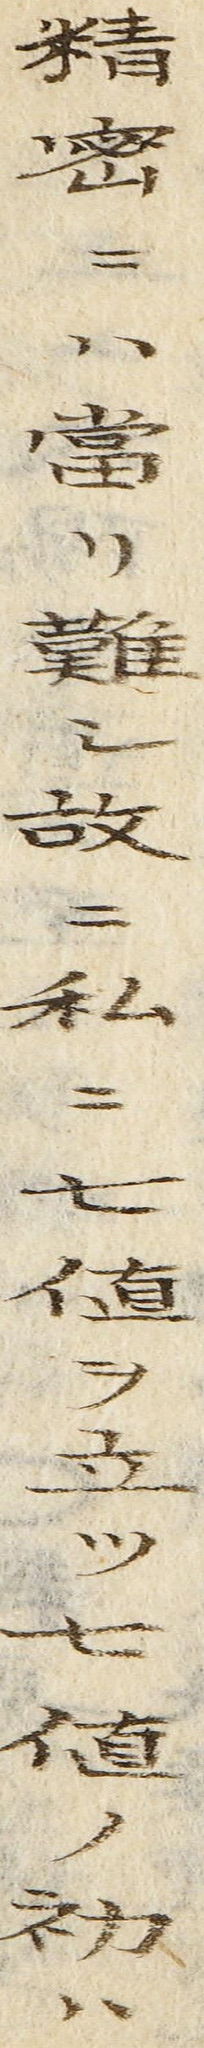精密ニハ当リ難シ故ニ私ニ七値ヲ立ツ七値ノ初ハ
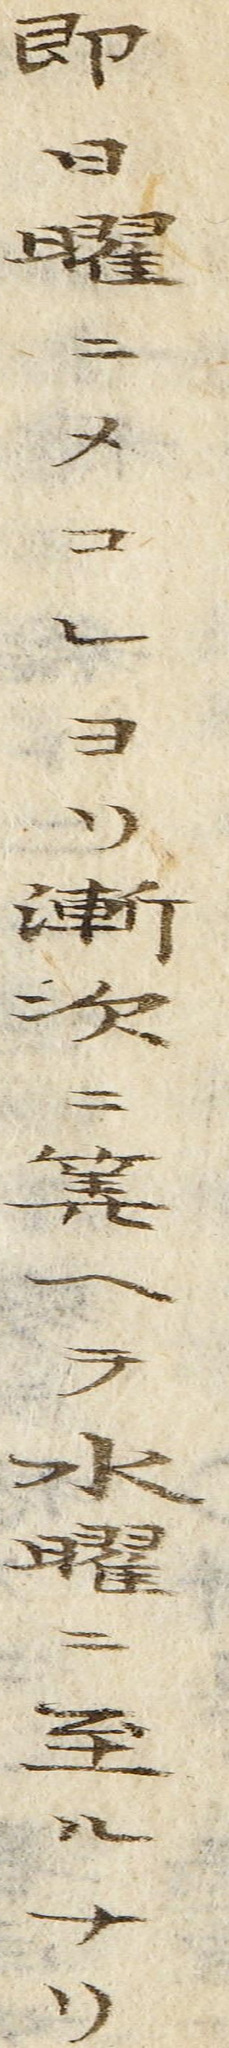即日曜ニシテコレヨリ漸次ニ算ヘテ水曜ニ至ルナリ
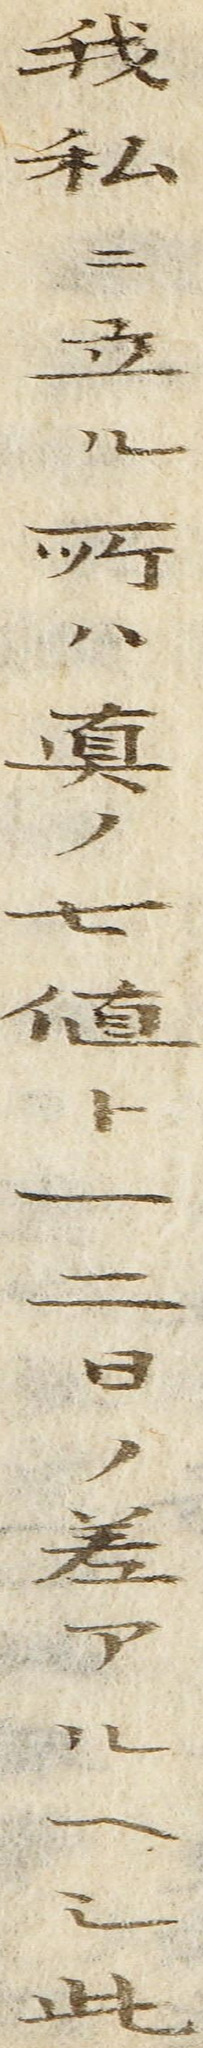我私ニ立ル所ハ真ノ七値ト一二日ノ差アルヘシ此
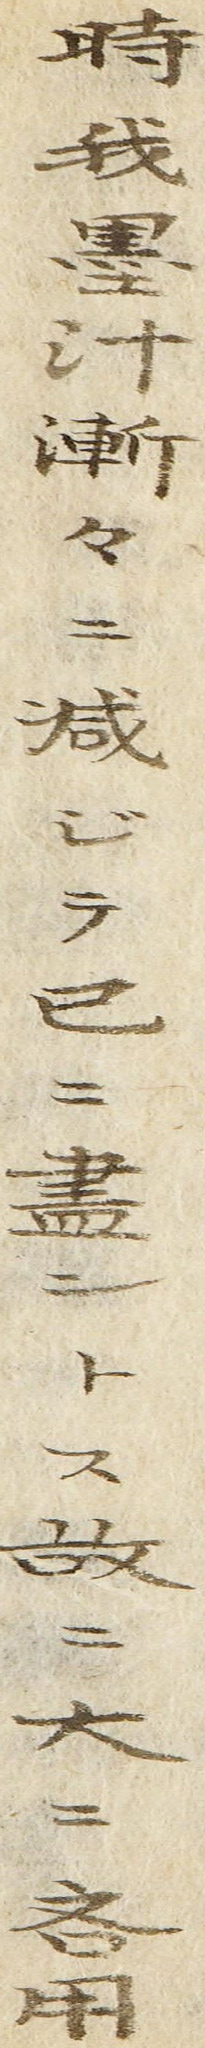時我墨汁漸々ニ減ジテ已ニ尽ントス故ニ大ニ吝用
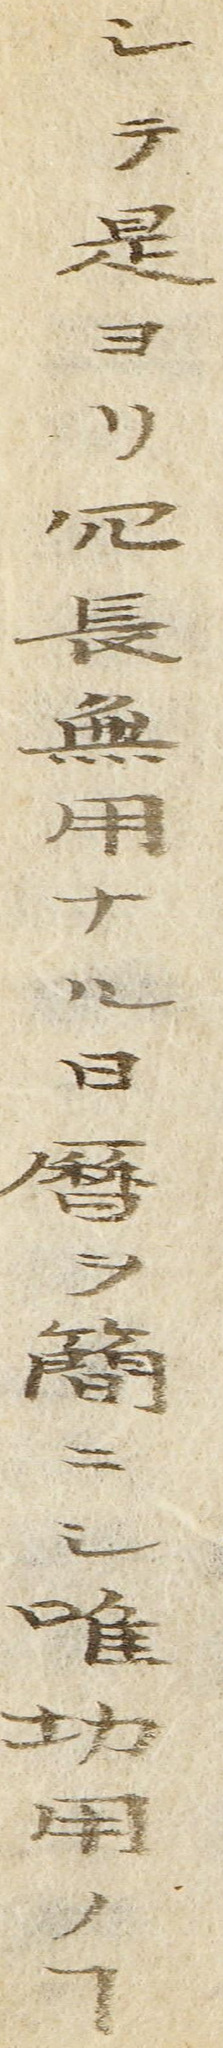シテ是ヨリ冗長無用ナル日暦ヲ簡ニシ唯功用ノコト

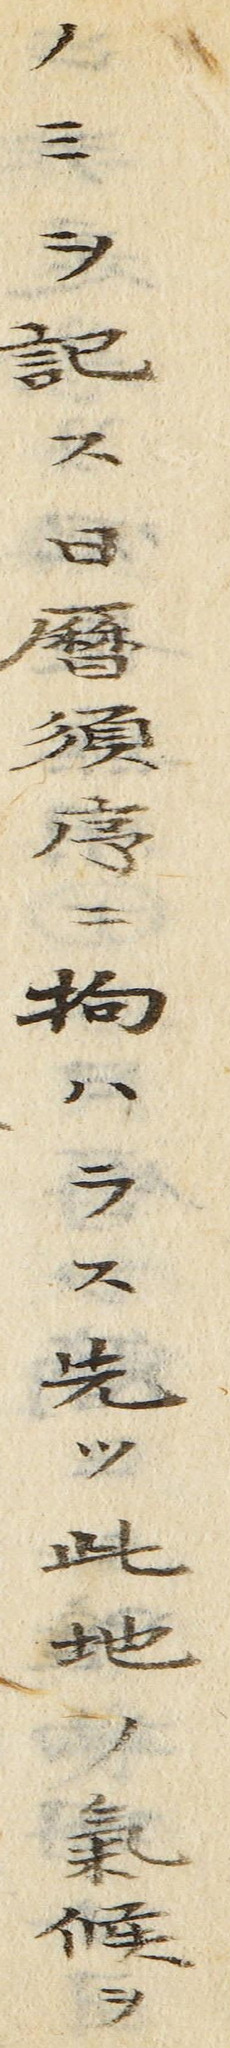ノミヲ記ス日暦須序ニ拘ハラス先ツ此地ノ気候ヲ
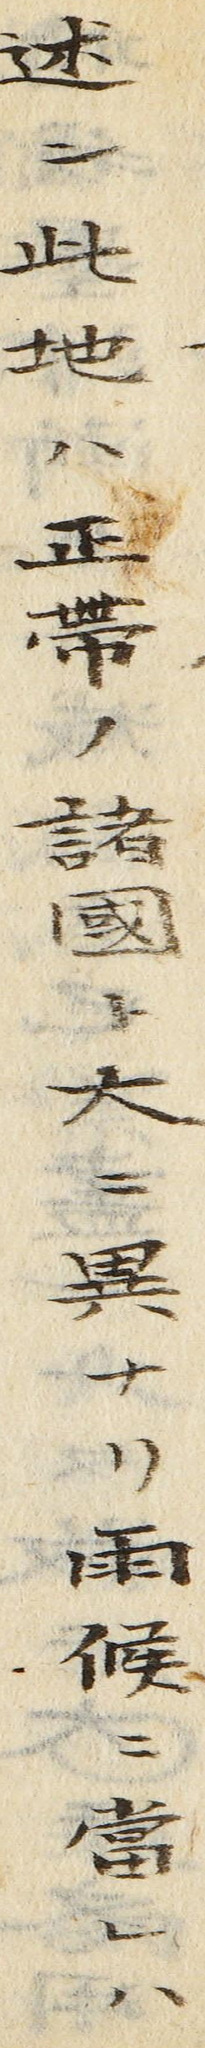述ン此地ハ正常ノ諸国ト大ニ異ナリ雨候ニ当レハ
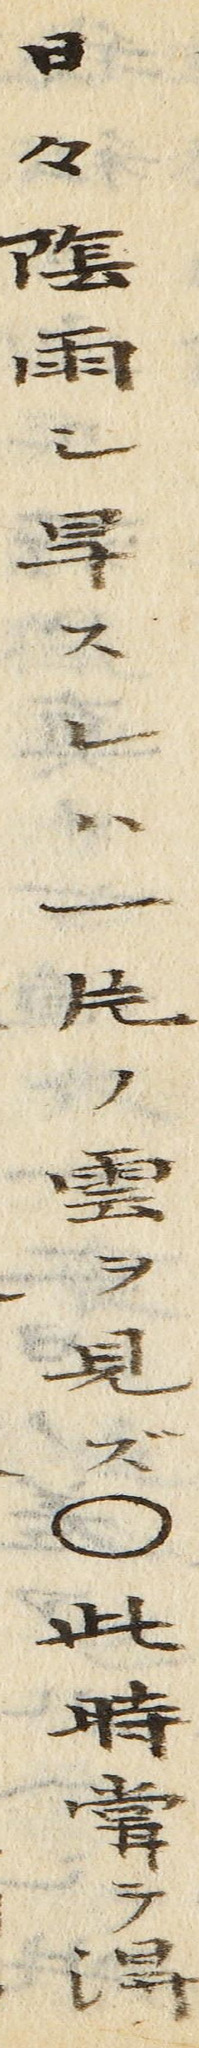日々陰雨シ旱スレハ一片ノ雲ヲ見ズ◯此時嘗テ得
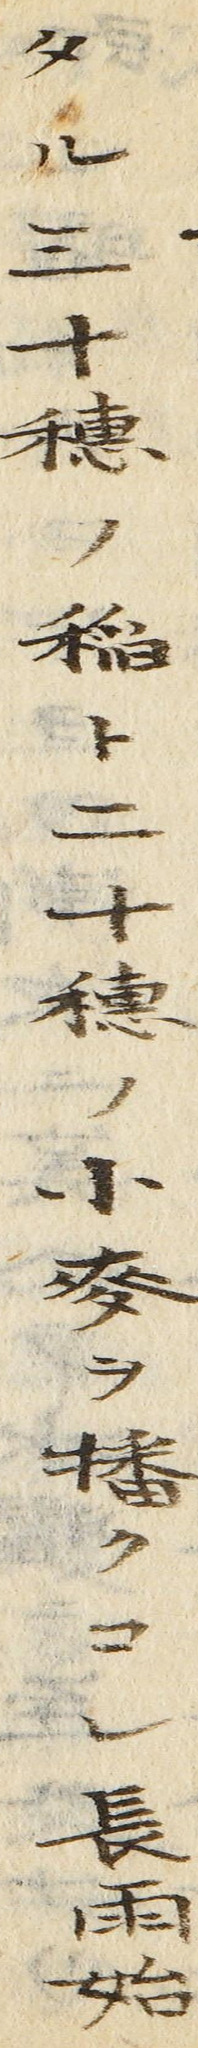タル三十穂ノ稲ト二十穂ノ小麦ヲ播クコレ長雨始
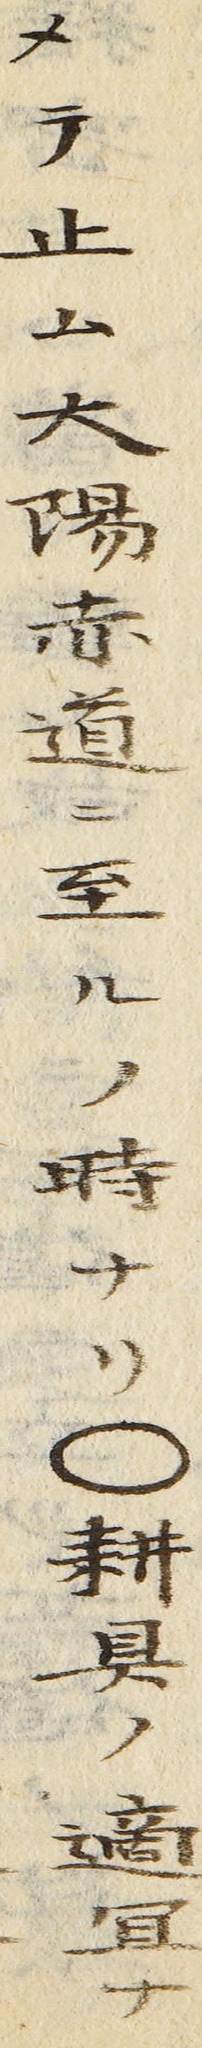メテ止ム大陽赤道ニ至ルノ時ナリ◯耕具ノ適宜ナ
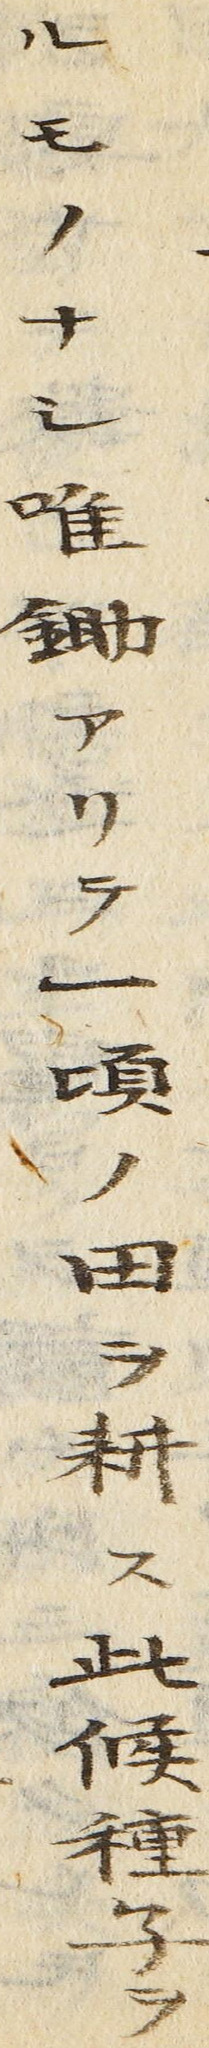ルモノナシ唯鋤アリテ一頃ノ田ヲ耕ス此候種子ヲ
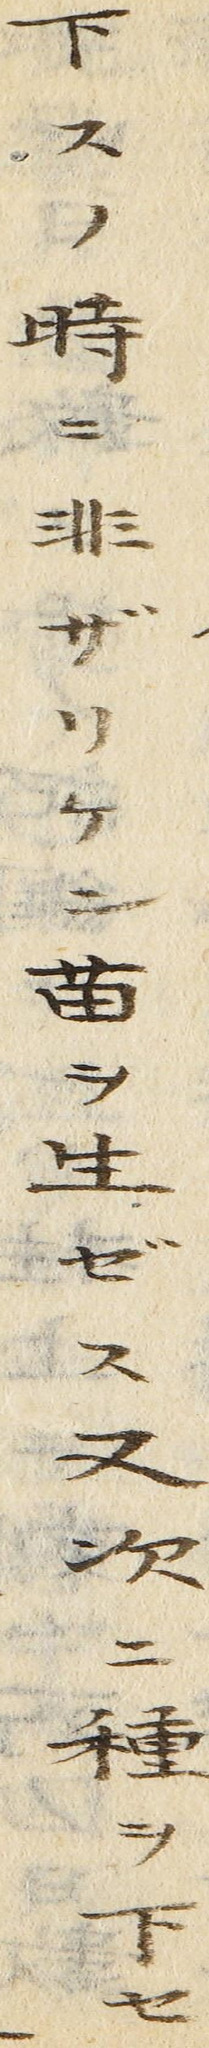下スノ時ニ非ザリケン苗ヲ生ゼス又次ニ種ヲ下セ
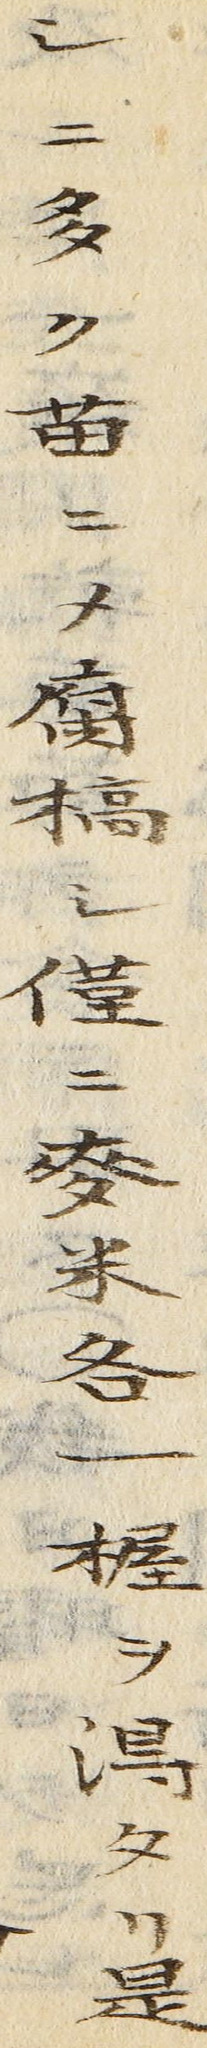シニ多ク苗ニシテ腐槁シ僅ニ麦米各一握ヲ得タリ是
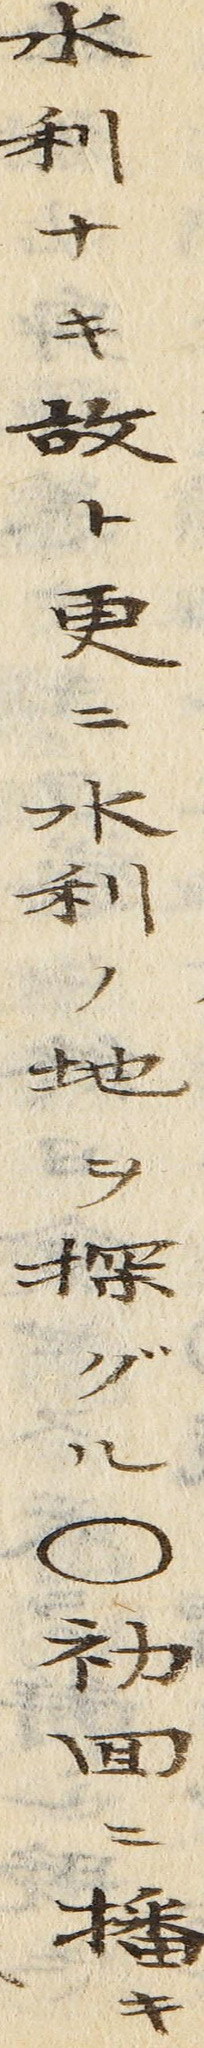水利ナキ故ト更ニ水利ノ地ヲ探グル◯初回ニ播キ
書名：漂流紀事
